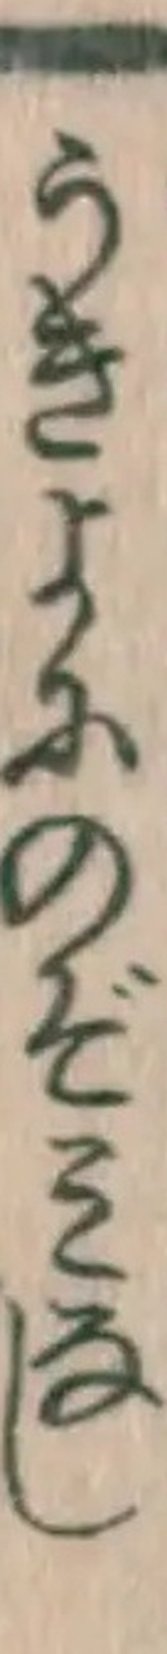うきよにのぞみなし
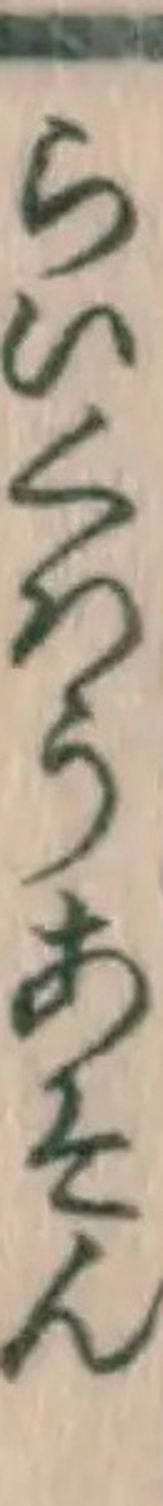らいくはうあそん
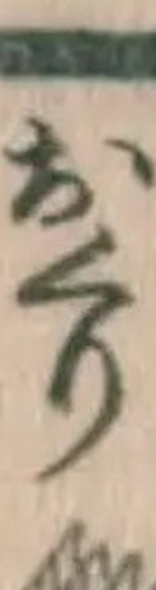おくり
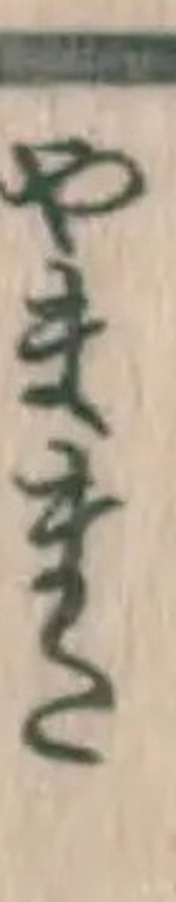やままた
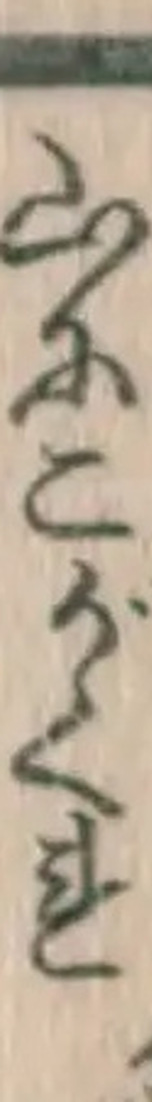山にこがくれ
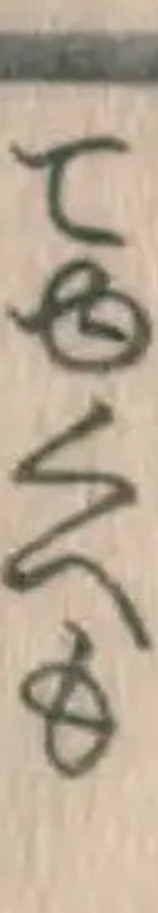てゆくへも
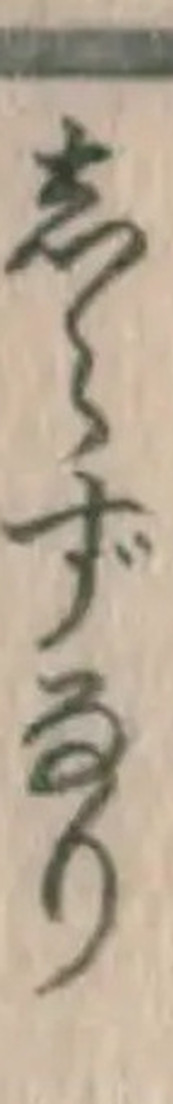しらずなり
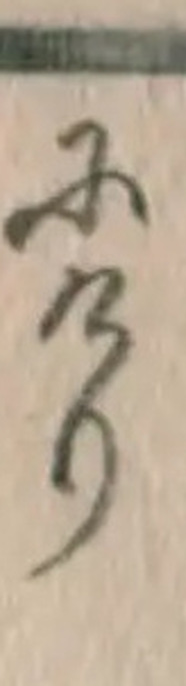にけり

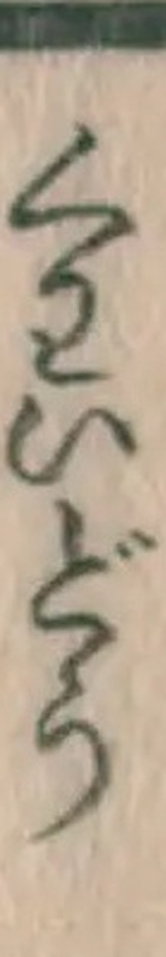くわいどう
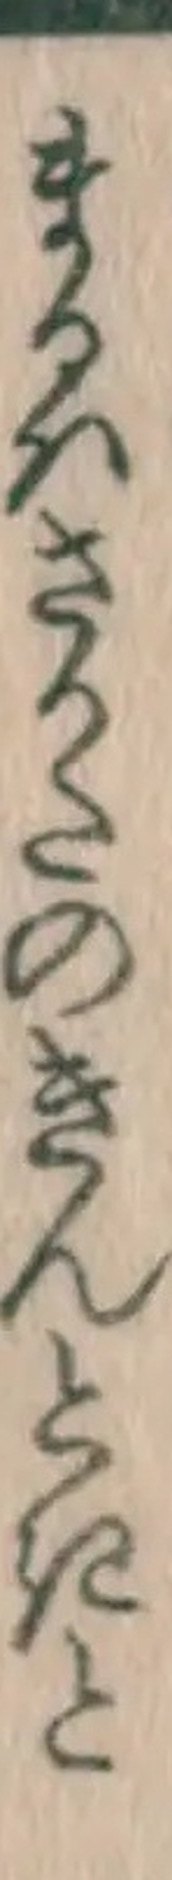まるはさかたのきんときと
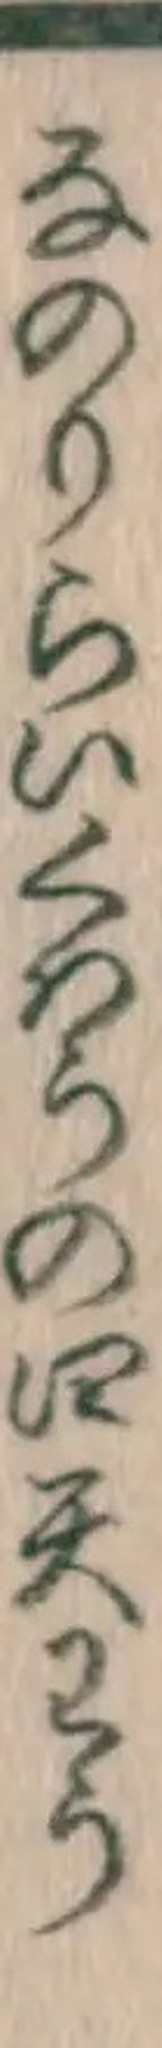なのりらいくはうの四天わう
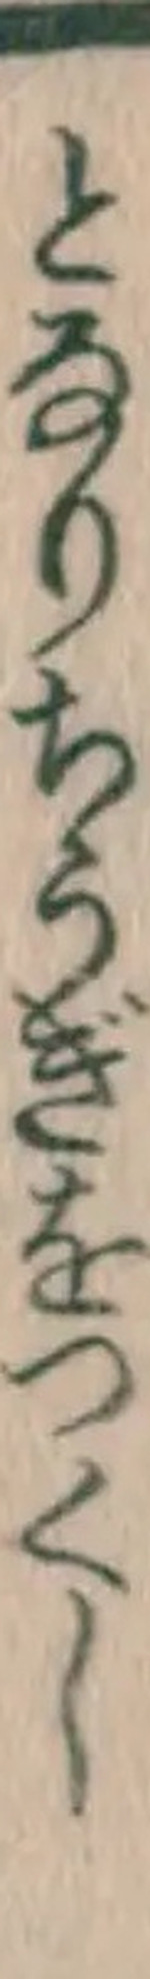となりちうぎをつくし
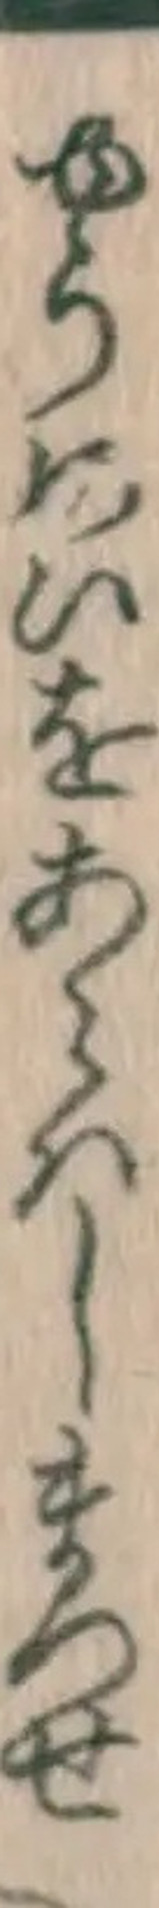ゆういをあらはしまつせ
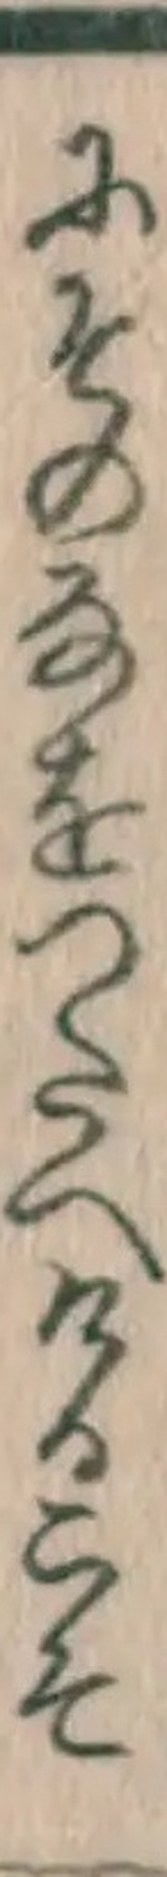にそのなをつたへけるこそ
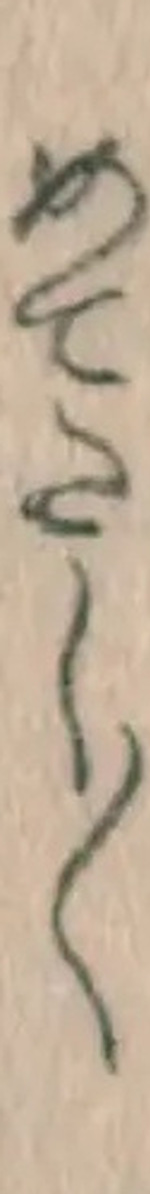めてたし〳〵
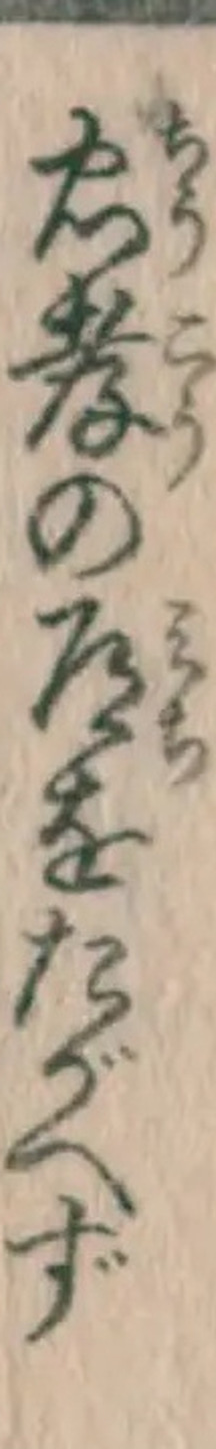忠孝の道をたがへず
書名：金太郎
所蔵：国立国会図書館 National Diet Library, JAPAN
